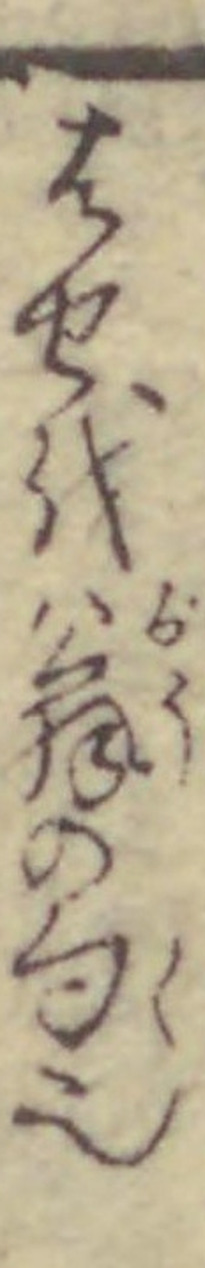はせを翁の句也
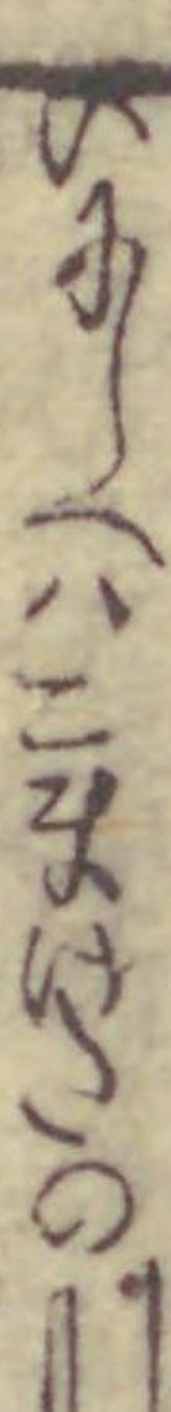いにしへはこまけたの
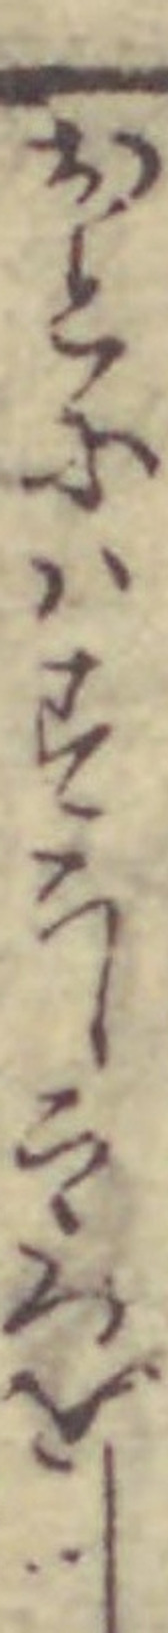おとにはすこしこゝろを
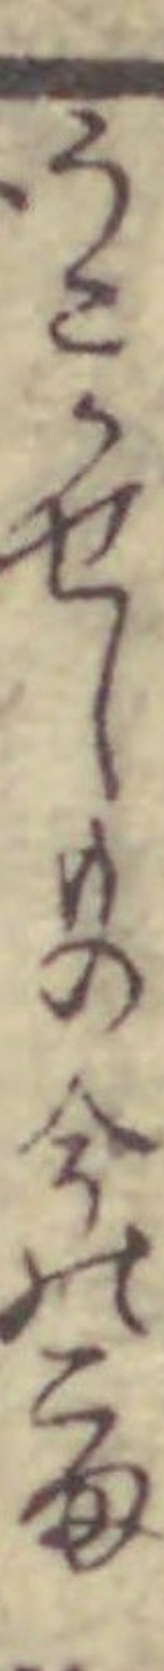うこかせしもの今のこま
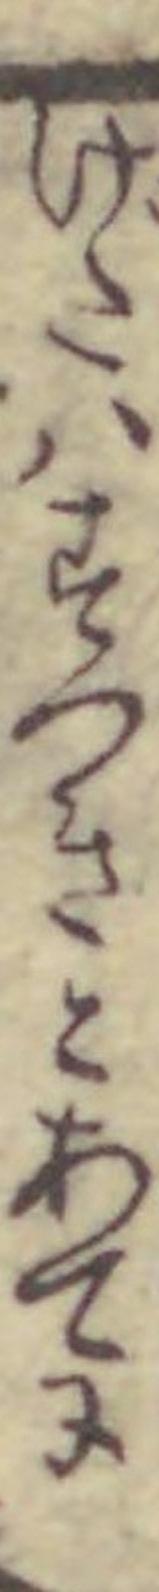げたはすつきとあてに
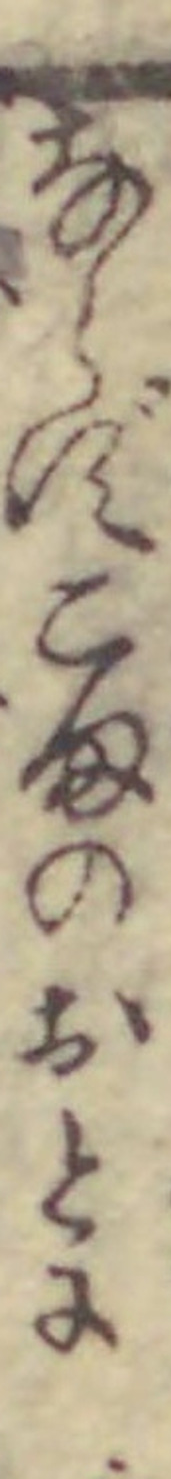ならずこまのおとに
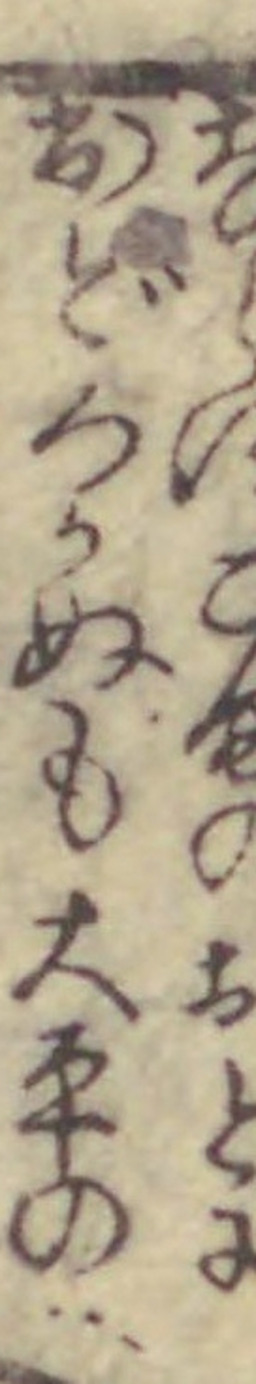おどろかぬも太平の
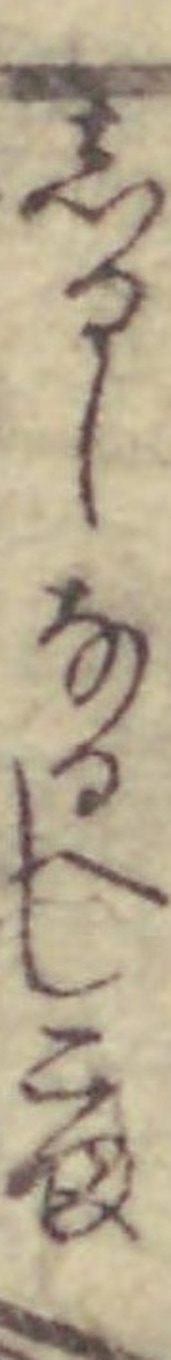しるしなるへしこま
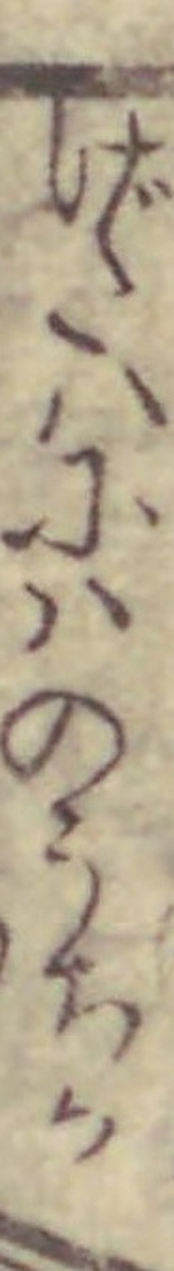げたはにはのうちか
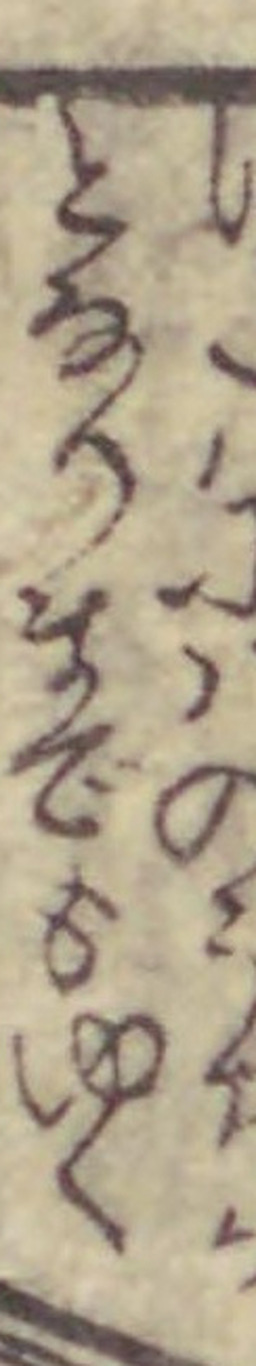となりまでもゆく
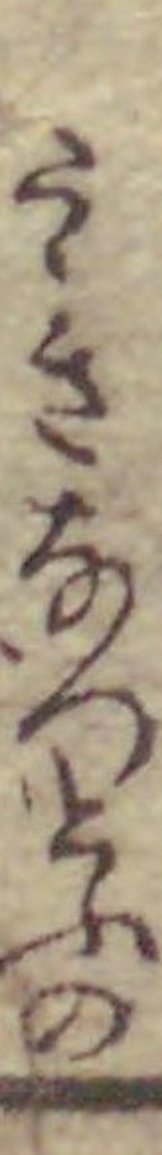たゝきなつとふの
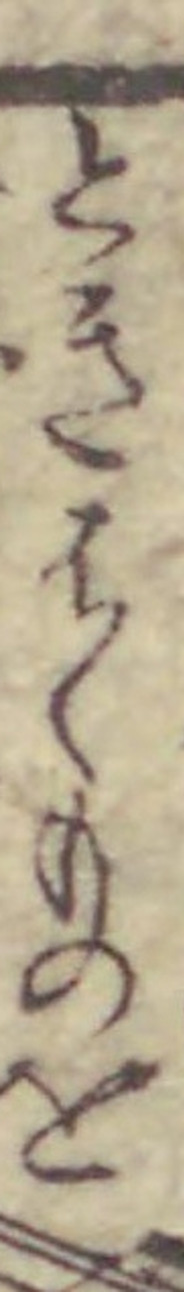ときはくものを
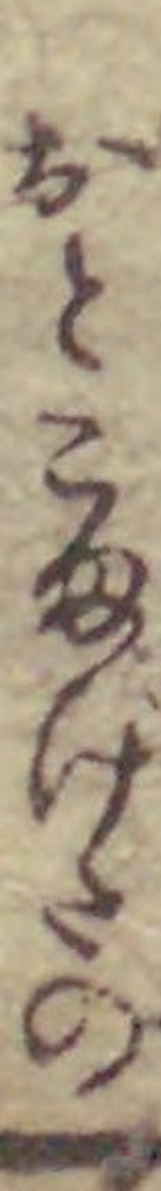おとこまげたの
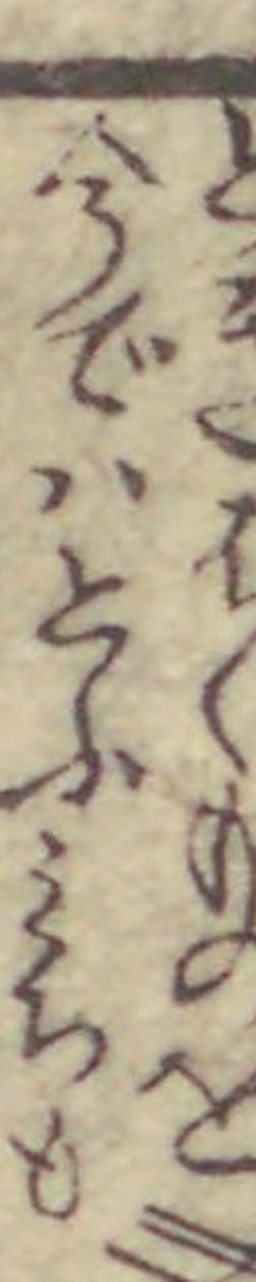今ではとふみちも
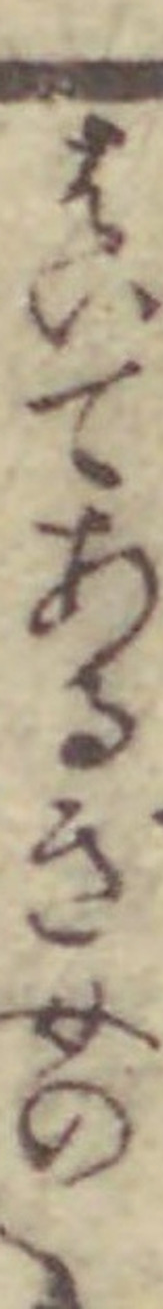はいてあるき女の
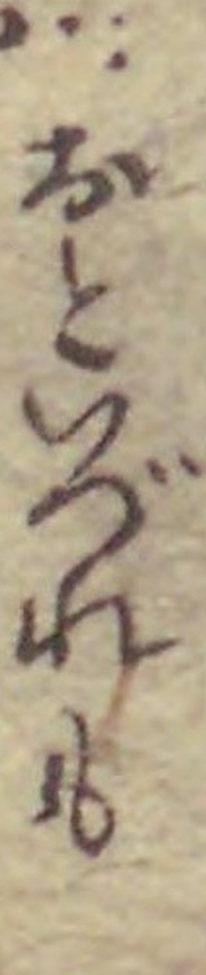おといづれも
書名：大通人穴[サガシ] 3巻
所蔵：国立国会図書館 National Diet Library, JAPAN
